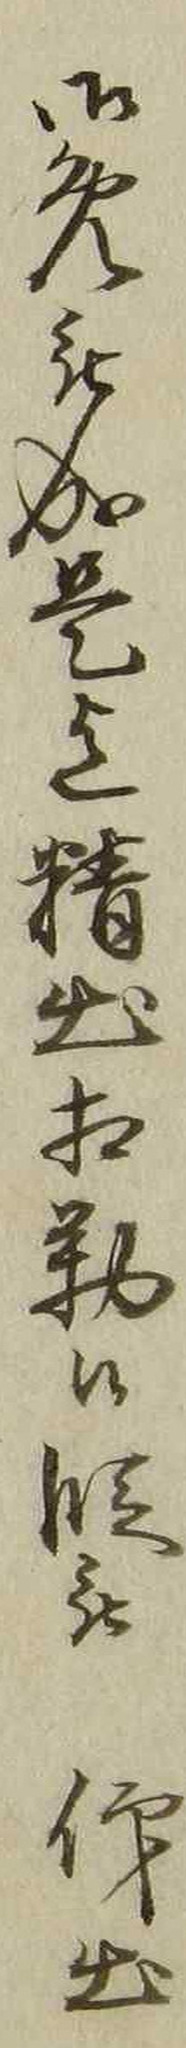御免被成是迄精出相勤候段被仰出
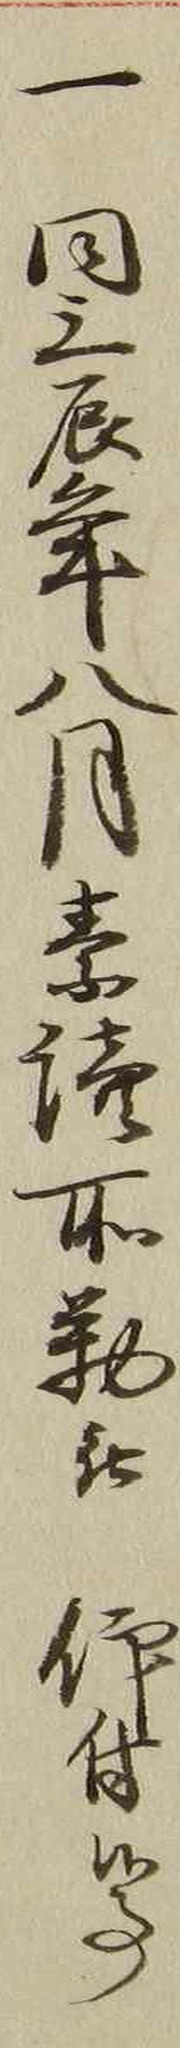一同三辰年八月素読所勤被仰付候事
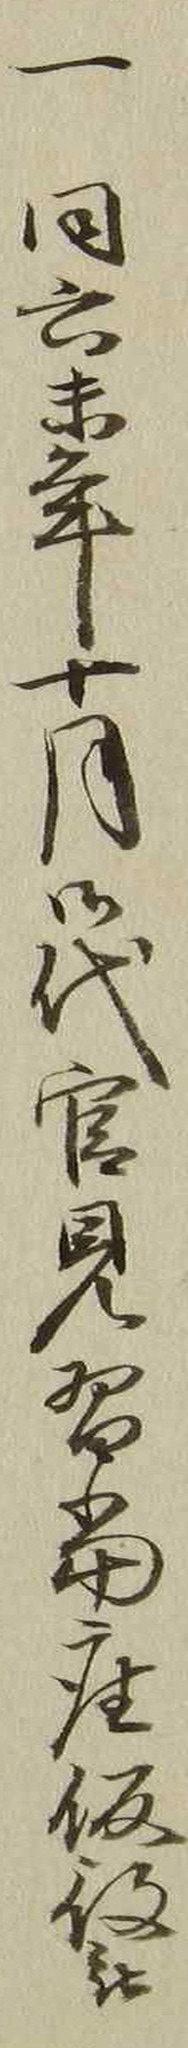一同六未年十月御代官見習当座仮役被
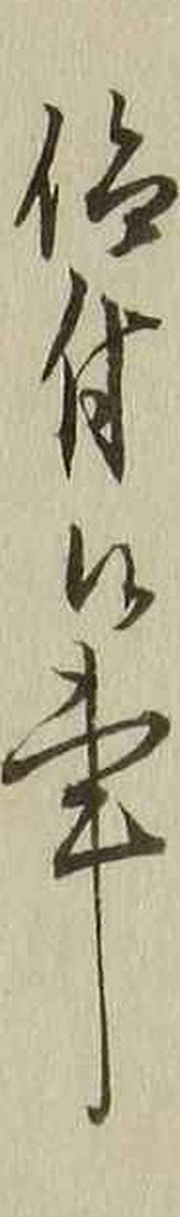仰付候事
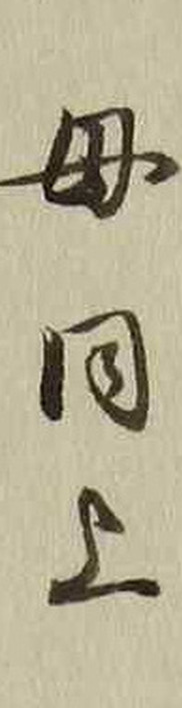母同上
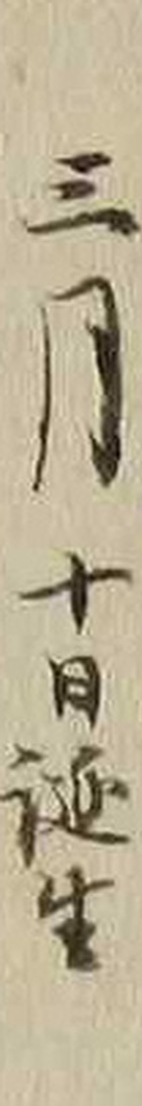三月十日誕生
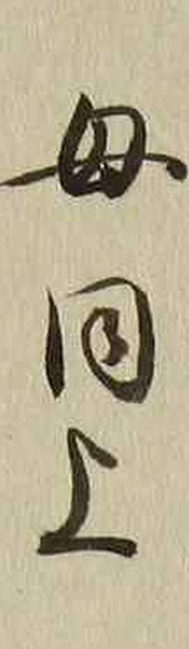母同上
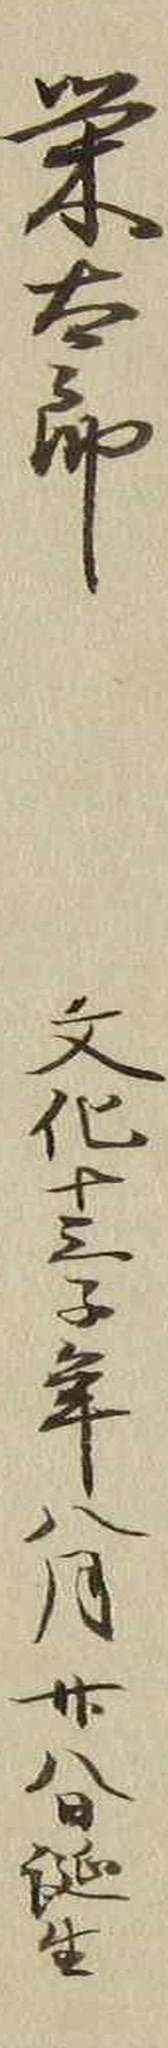栄太郎文化十三子年八月廿八日誕生
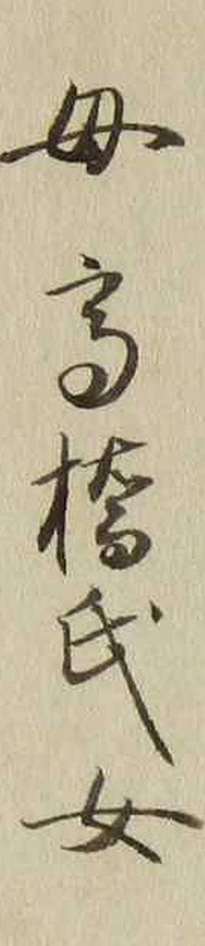母高橋氏女
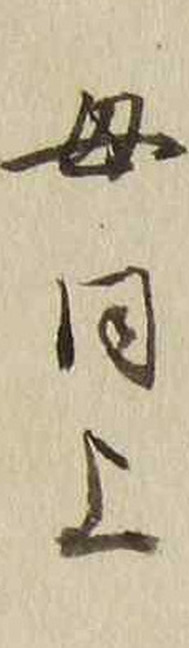母同上

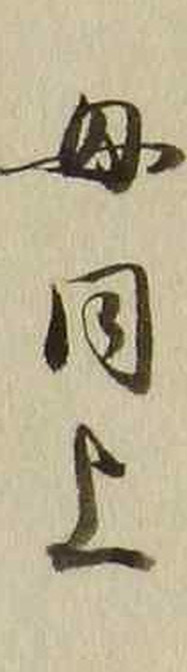母同上
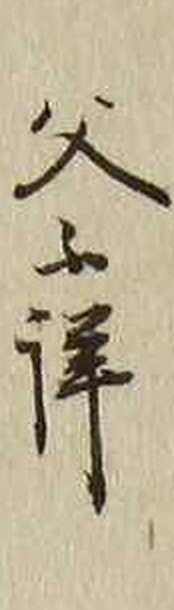父ふ詳
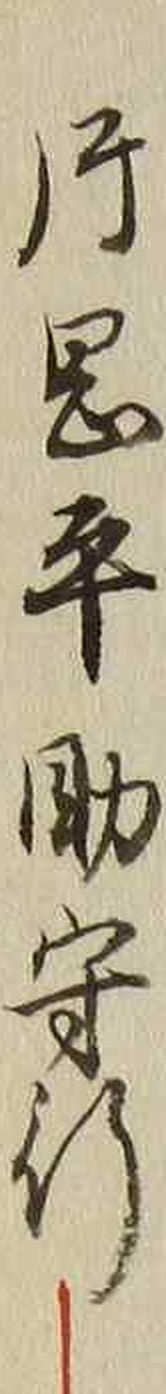片岡平助守行
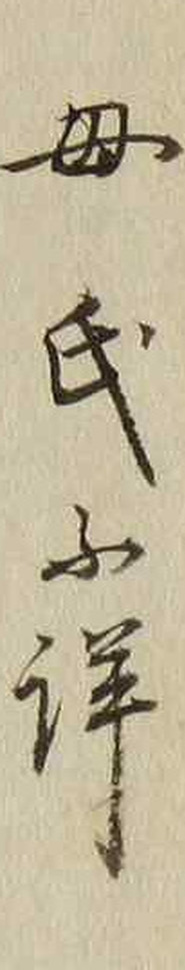母氏ふ詳
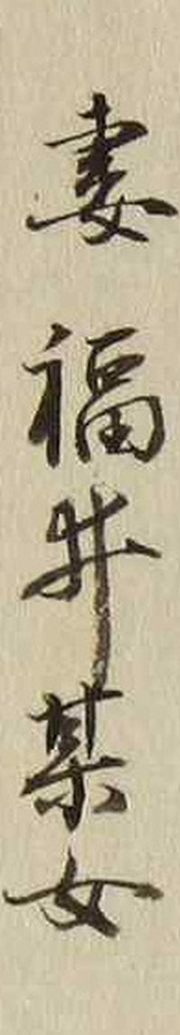妻福井某女
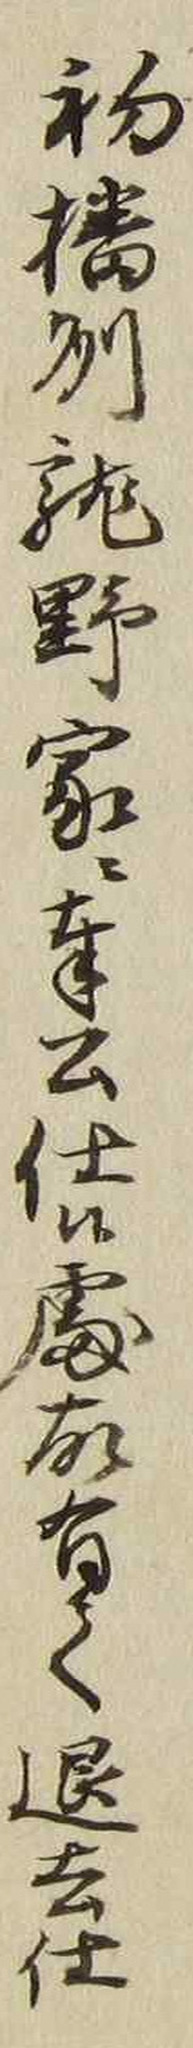初播州龍野家ニ奉公仕候處故有之退去仕
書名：諸士系譜　巻之114　か之部22
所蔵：会津若松市立会津図書館
